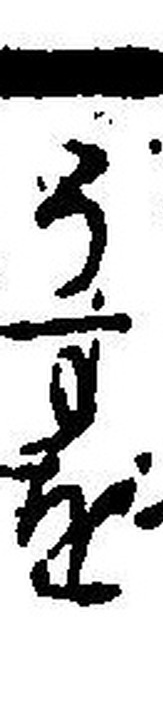うすを
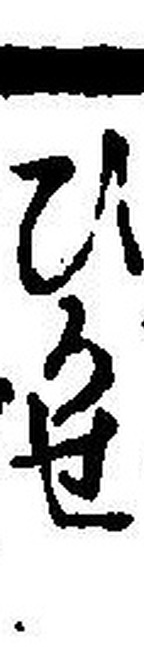ひかせ
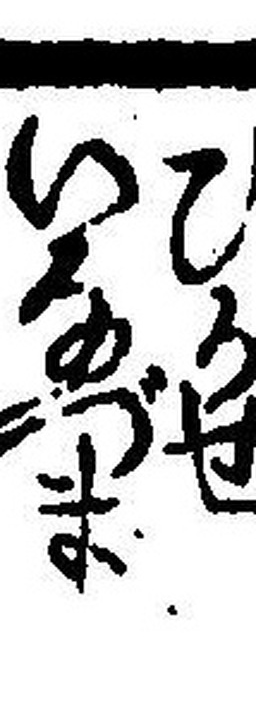いなづま
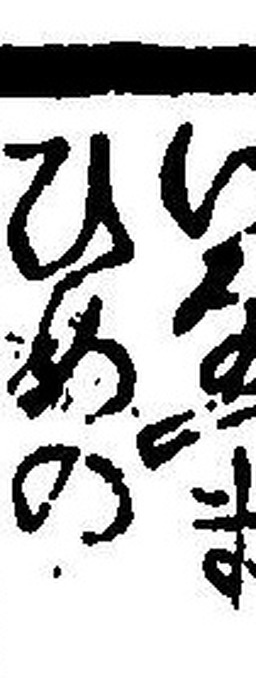ひめの
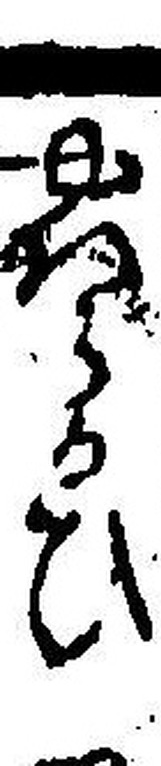やはらかひ
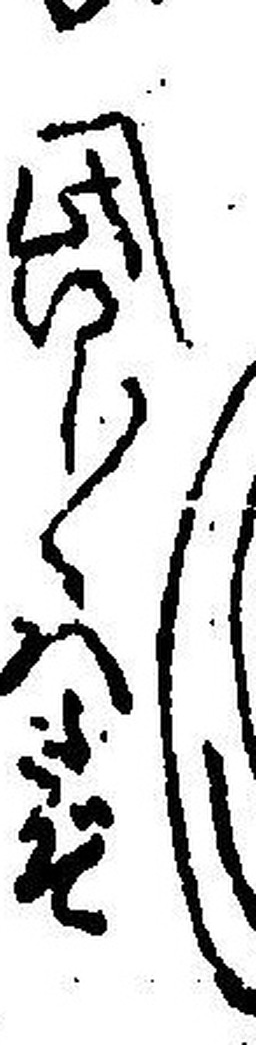〽此いし〳〵はさぞ
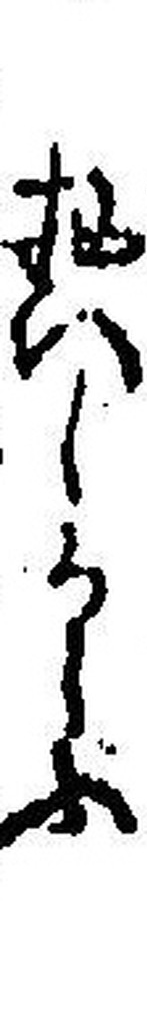おいしからふ
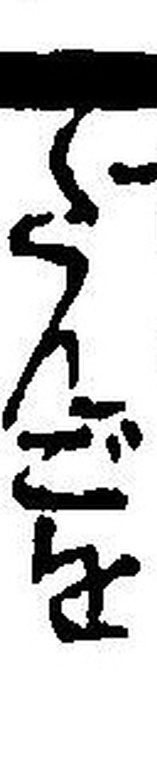たんごを
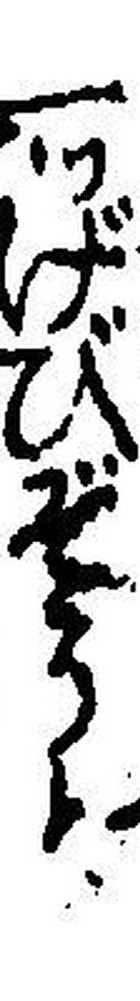一つげびぞうと
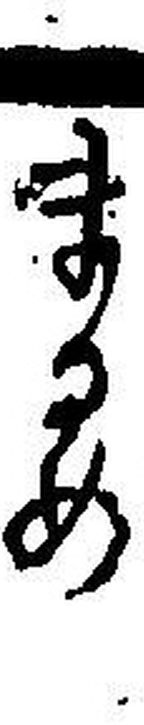まるめ
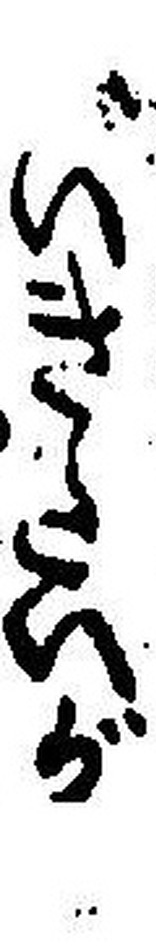いきたいが
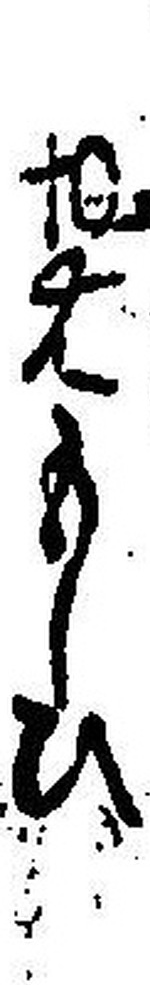おはもしひ
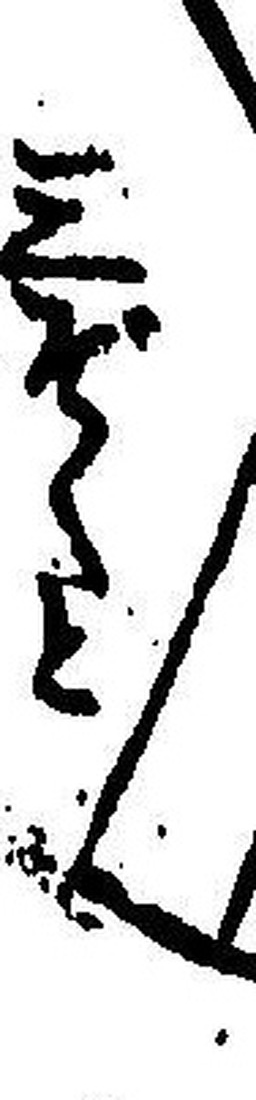三ぞくとい
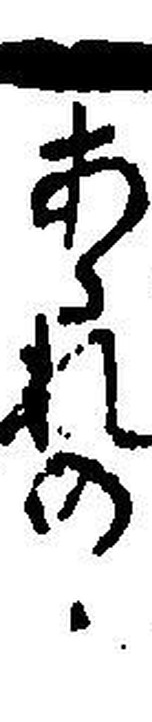あられの
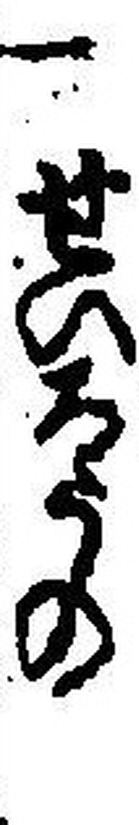せいろうの
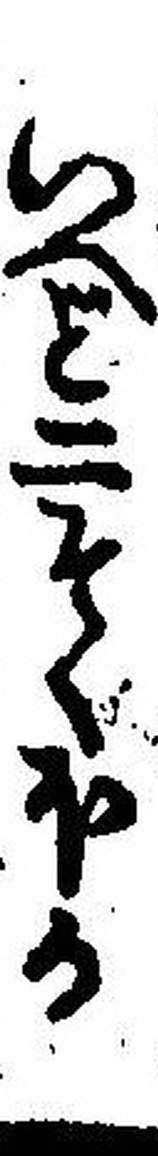いへど二そくほか
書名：徳若水縁起金性 / 樹下石上作
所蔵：東京大学総合図書館 General Library in the University of Tokyo, JAPAN
